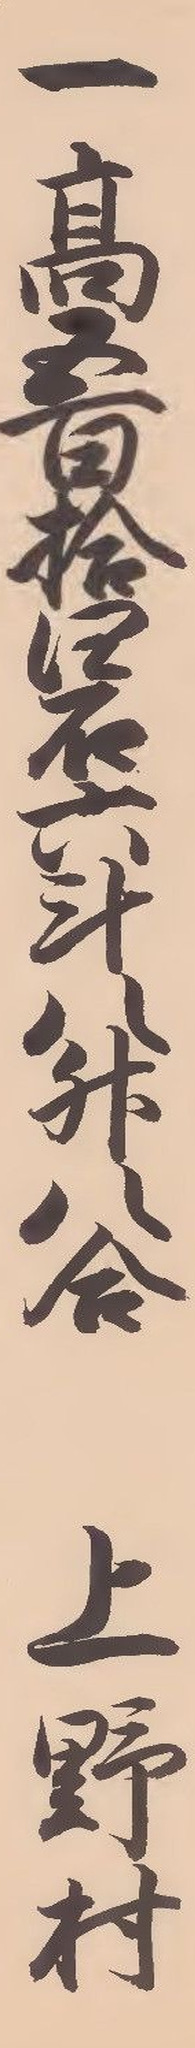一高五百拾四石六斗八升八合上野村

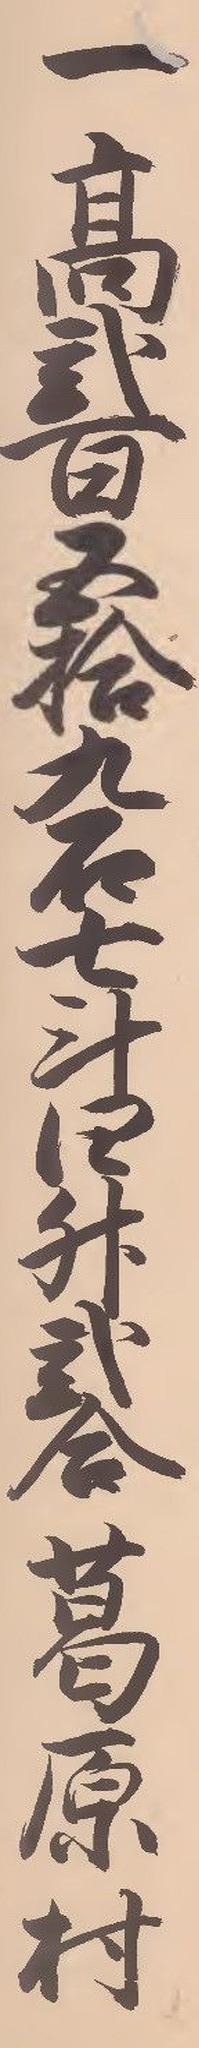一高弐百五拾九石七斗四升弐合葛原村
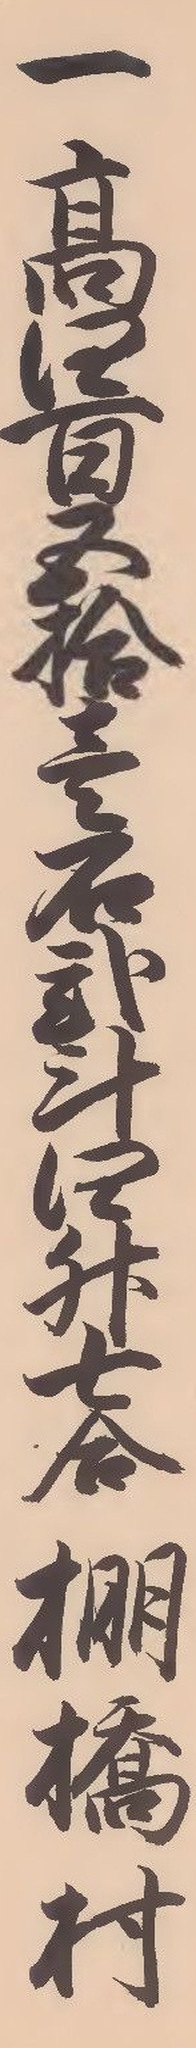一高四百五拾壱石弐斗四升七合棚橋村
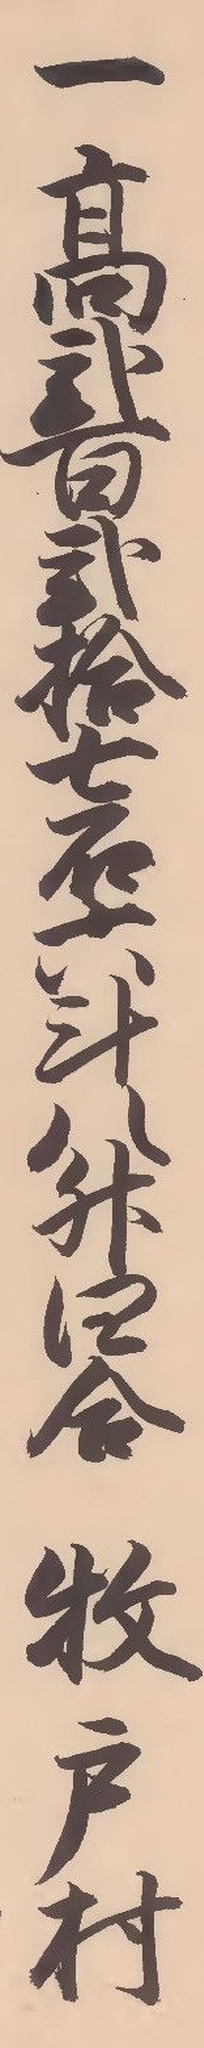一高弐百弐拾七石六斗八升四合牧戸村
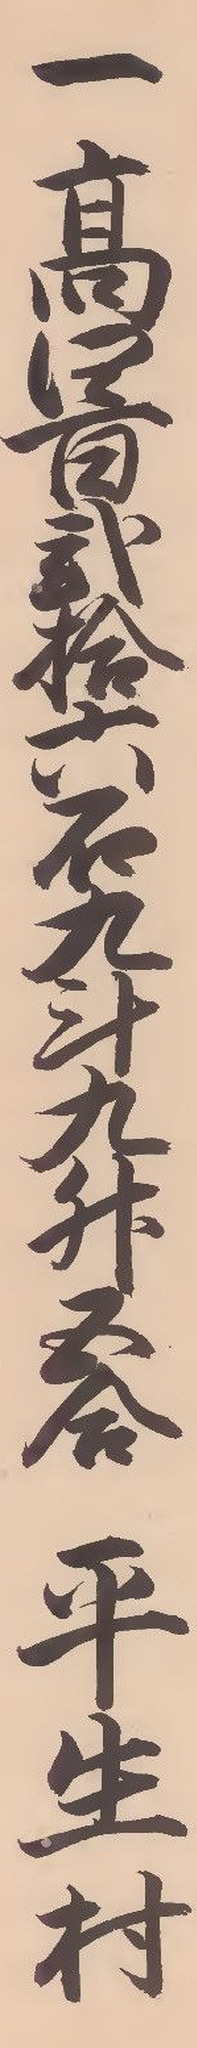一高四百弐拾六石九斗九升五合平生村

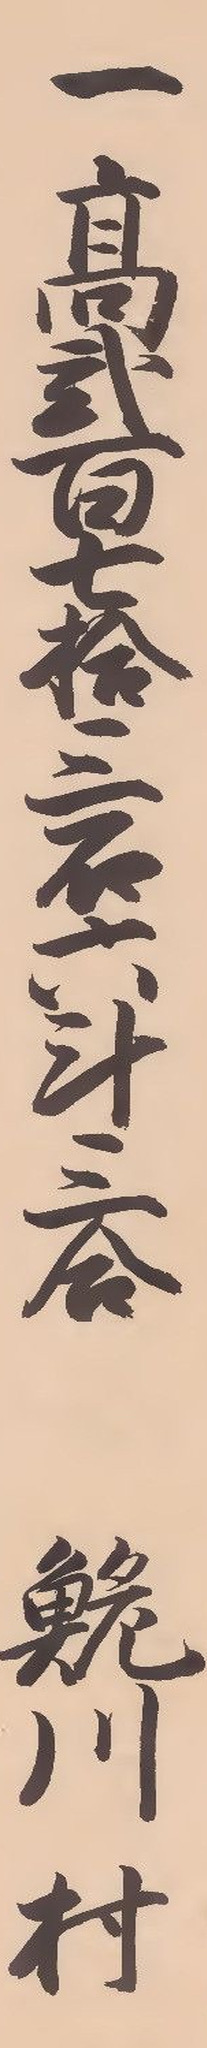一高弐百七拾三石六斗三合鮠川村
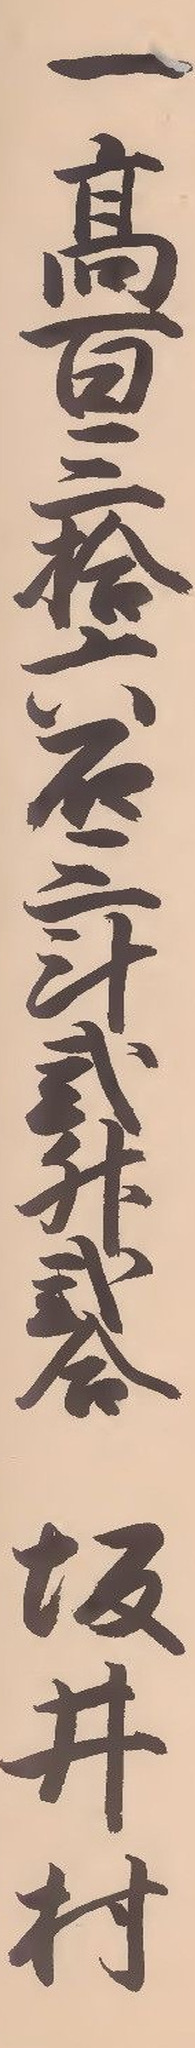一高百三拾六石三斗弐升弐合坂井村
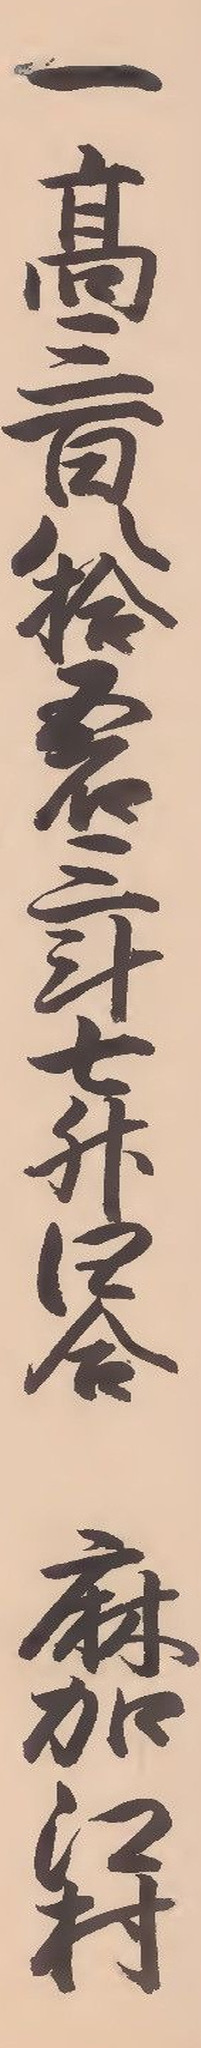一高三百八拾五石三斗七升四合麻加江村
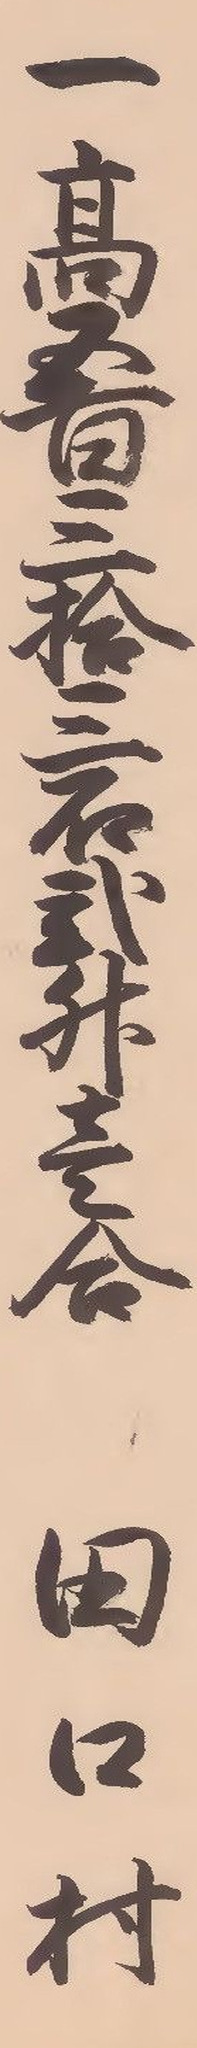一高五百三拾三石弐升壱合田口村
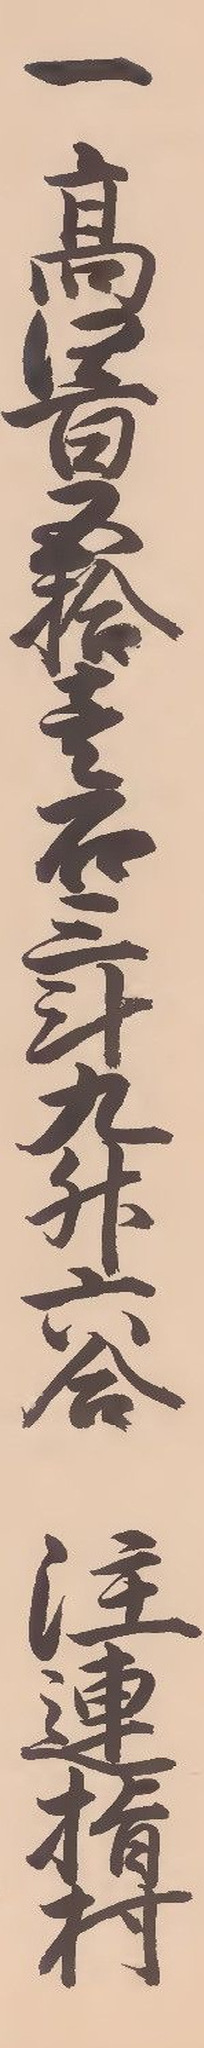一高四百五拾壱石三斗九升六合注連指村
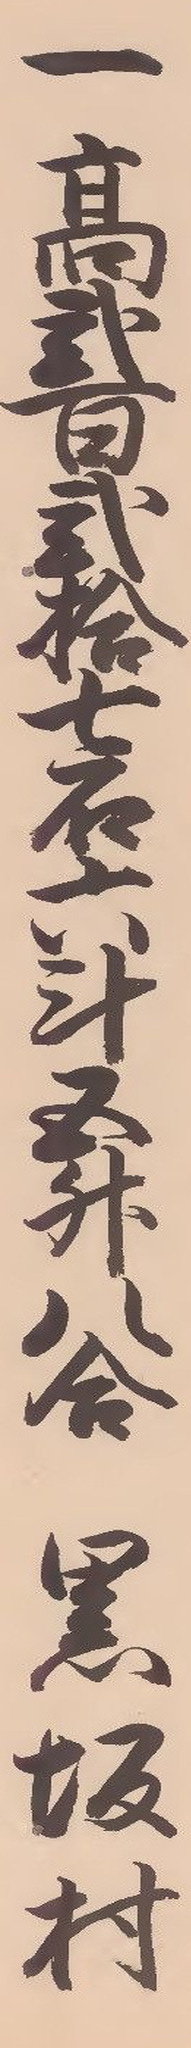一高弐百弐拾七石六斗五升八合黒坂村

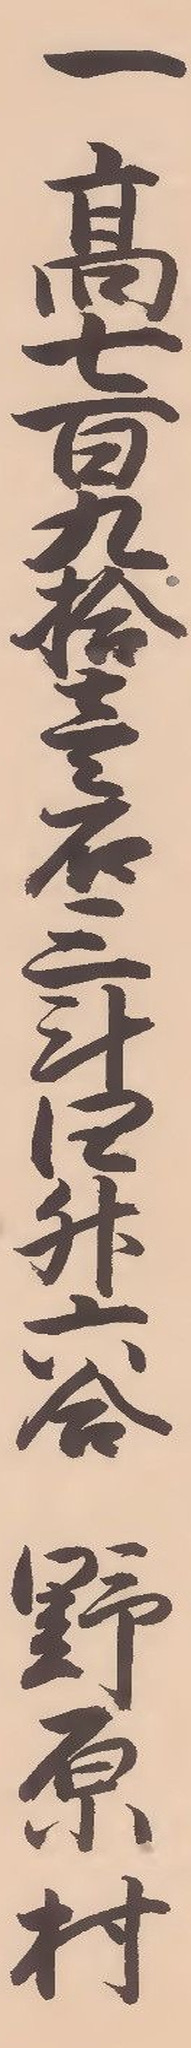一高七百九拾壱石三斗四升六合野原村

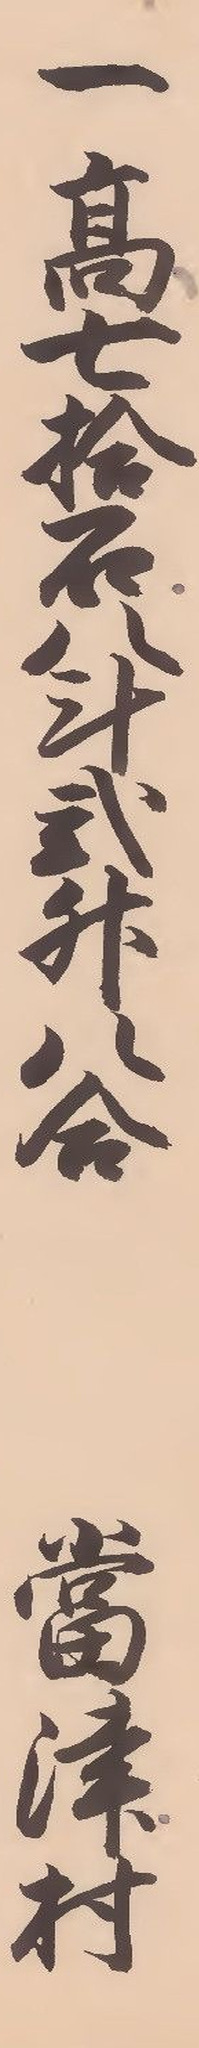一高七拾石八斗弐升八合当津村
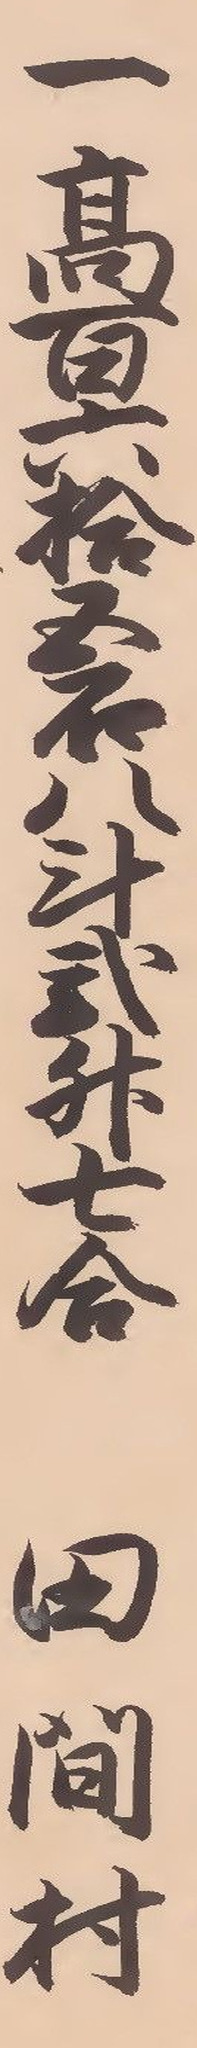一高百六拾五石八斗弐升七合田間村
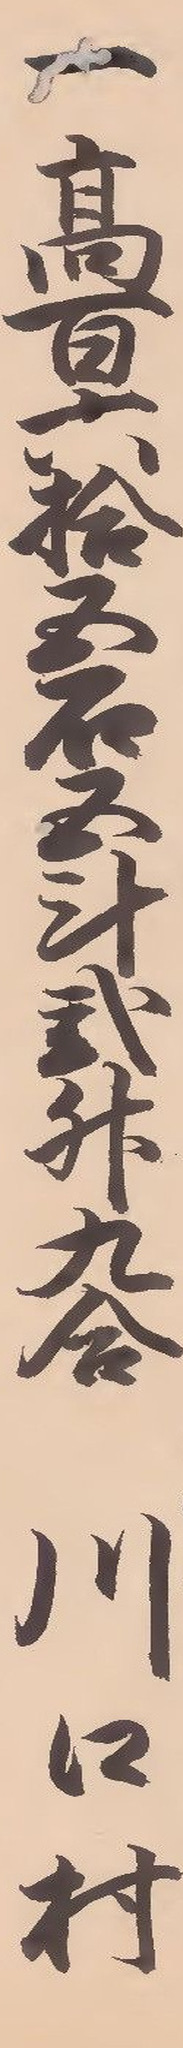一高百六拾五石八斗弐升七合田間村

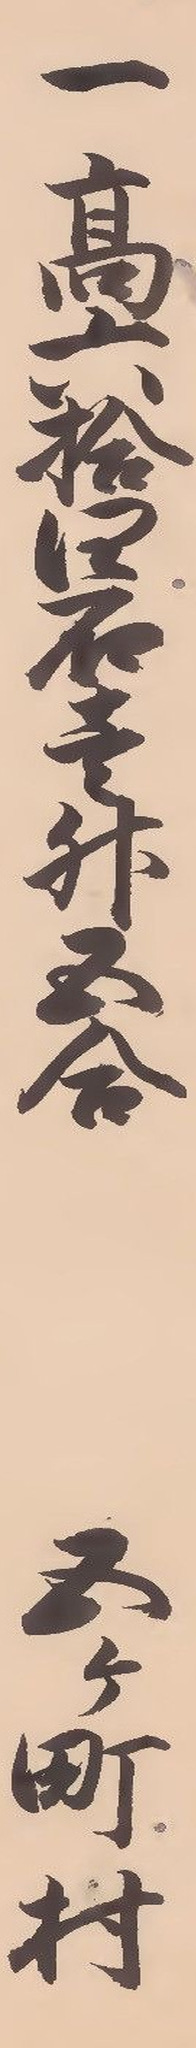一高六拾四石壱升五合五ケ町村
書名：伊勢国郷帳
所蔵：国立公文書館 National Archives of Japan
